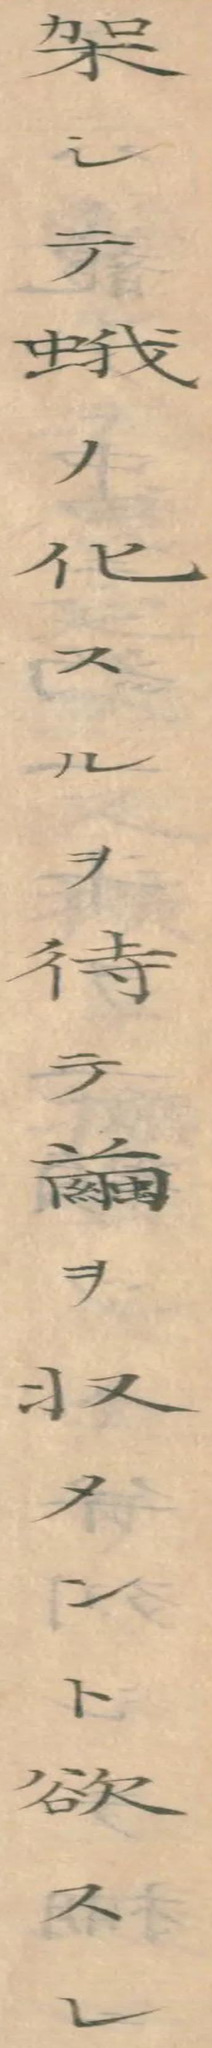架シテ蛾ノ化スルヲ待テ繭ヲ収メント欲スレ
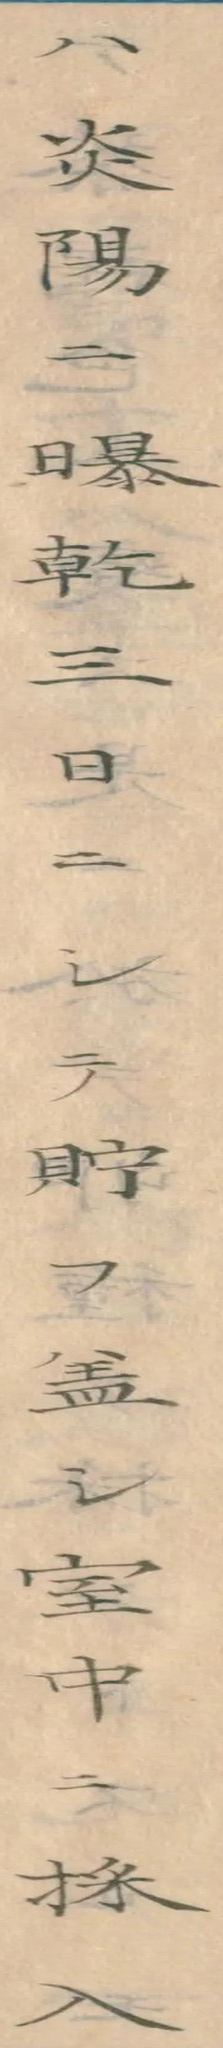ハ炎陽ニ曝乾三日ニシテ貯フ蓋シ室中ニ採入
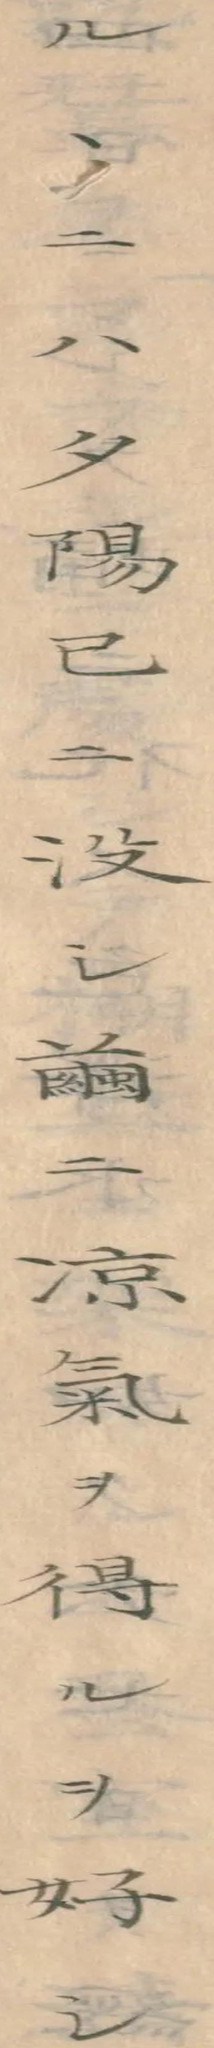ルヽニハ夕陽已ニ没シ繭ニ涼気ヲ得ルヲ好シ
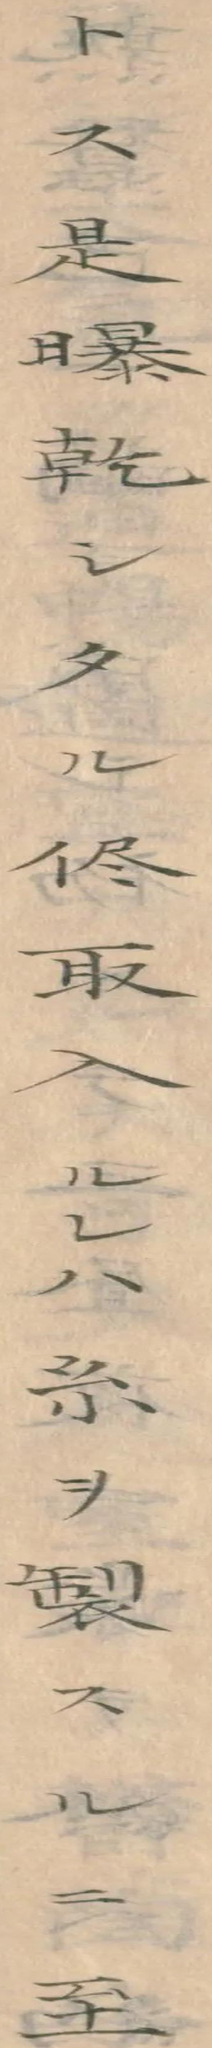トス是曝乾シタル侭取入ルレハ糸ヲ製スルニ至
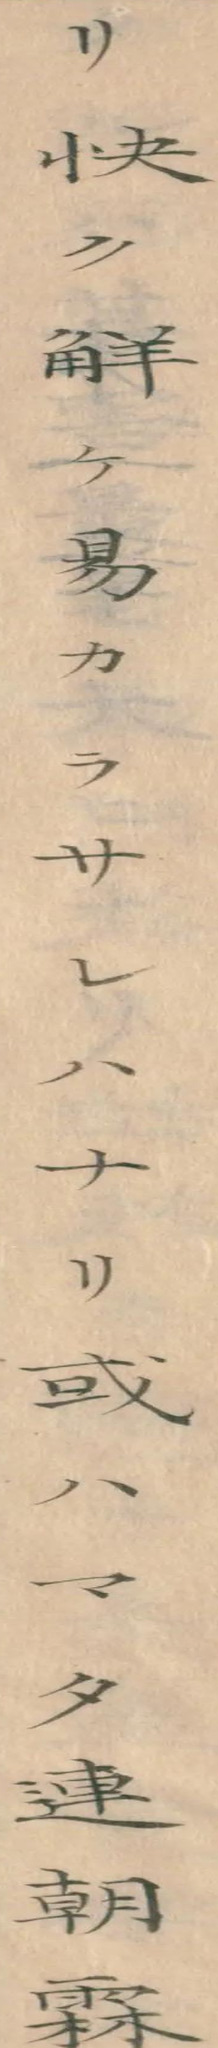リ快ク解ケ易カラサレハナリ或ハマタ連朝霖
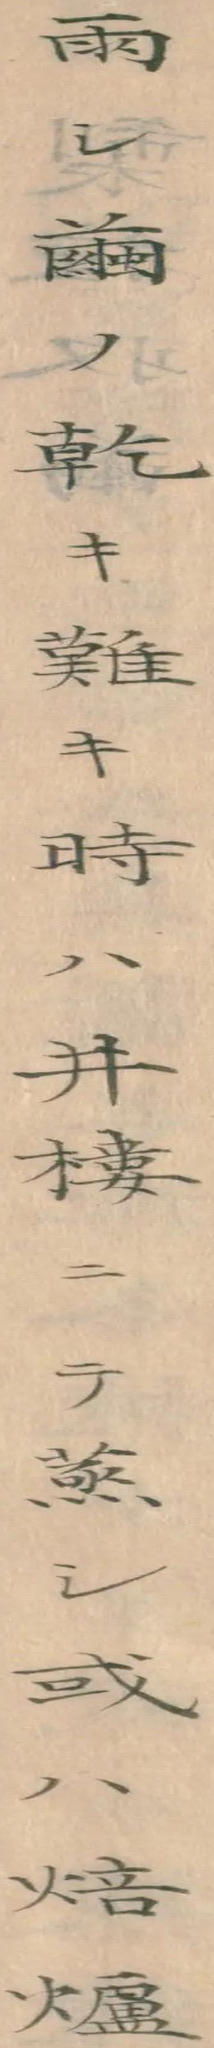雨シ繭ノ乾キ難キ時ハ井楼ニテ蒸シ或ハ焙炉
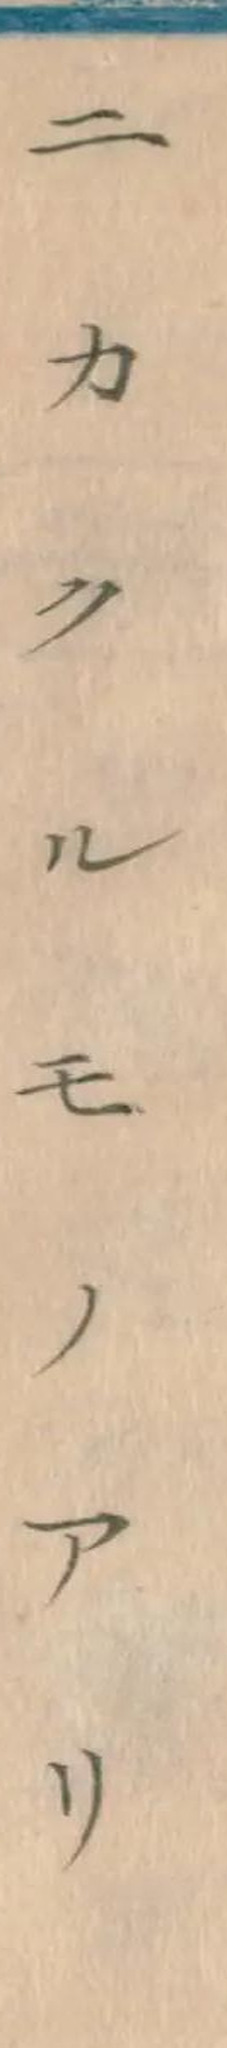ニカクルモノアリ
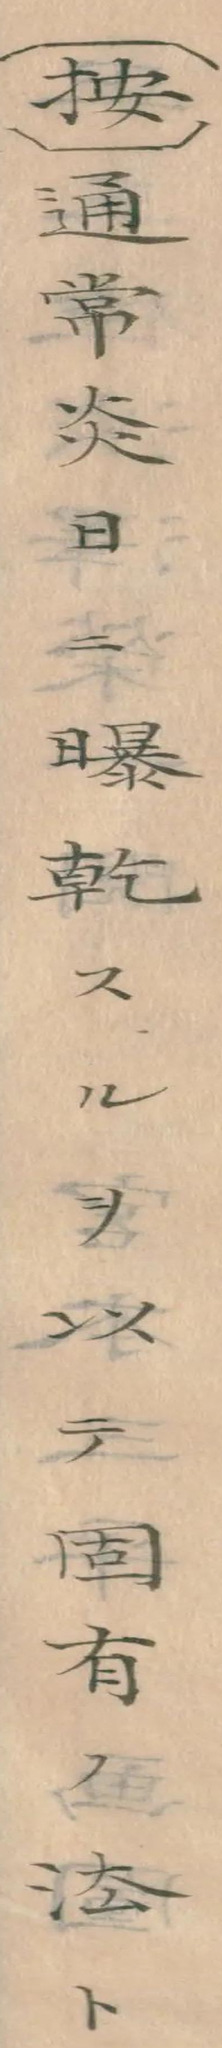[按]通常炎日ニ曝乾スルヲ以テ固有ノ法ト
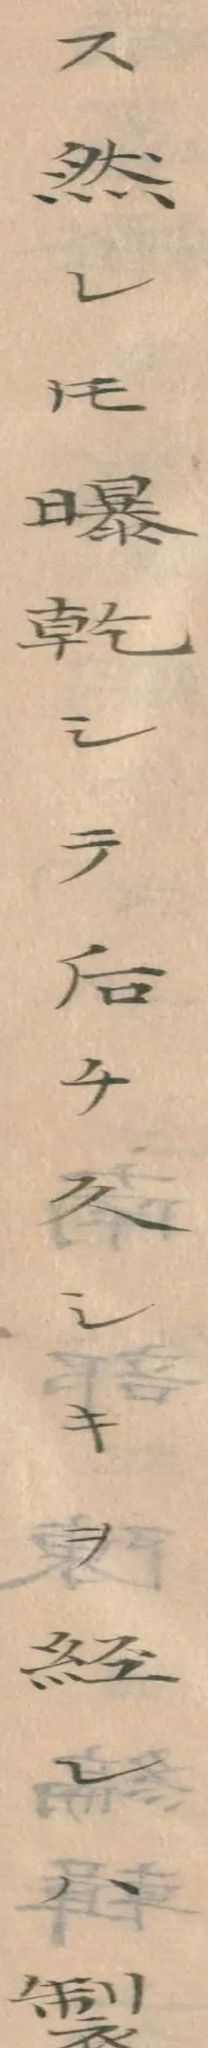ス然レトモ曝乾シテ后チ久シキヲ経レハ製
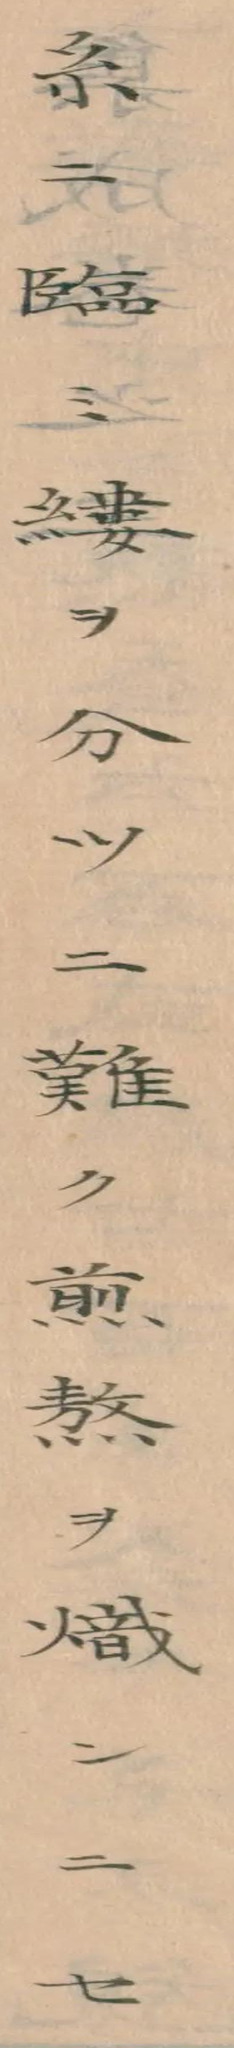糸ニ臨ミ縷ヲ分ツニ難ク煎熬ヲ熾ンニセ
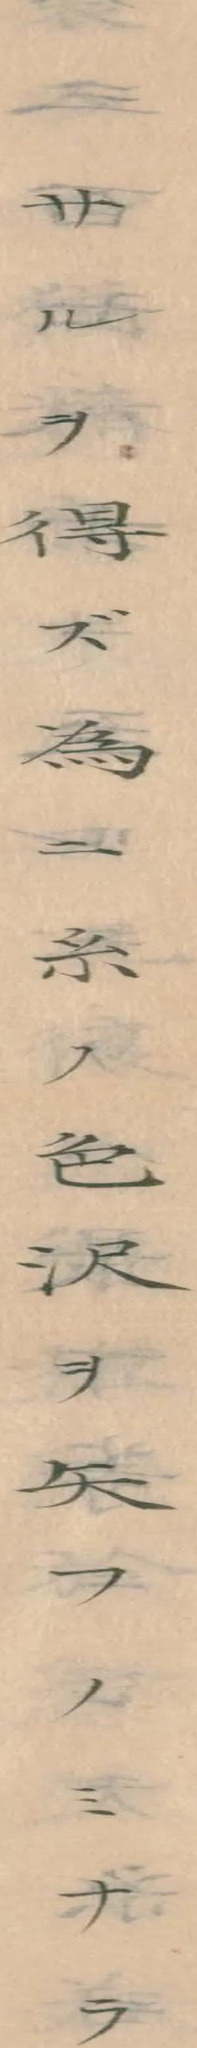サルヲ得ズ為ニ糸ノ色沢ヲ失フノミナラ
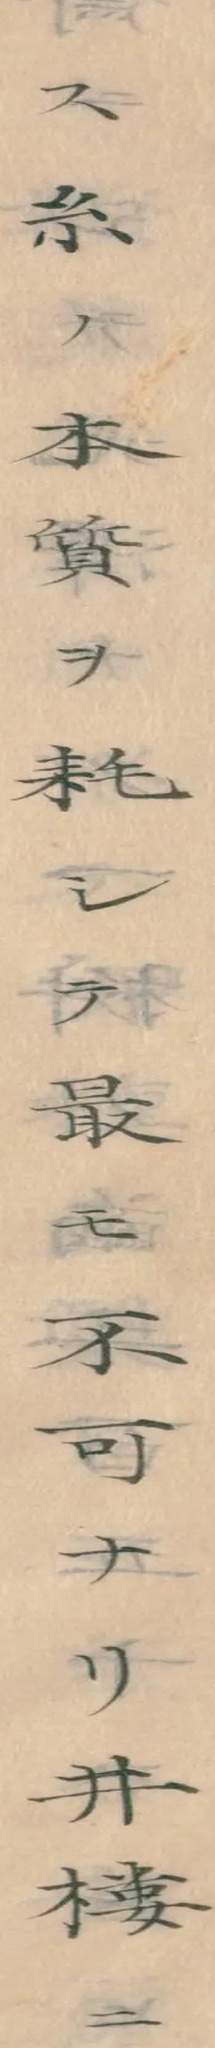ス糸ノ本質ヲ耗シテ最モ不可ナリ井楼ニ
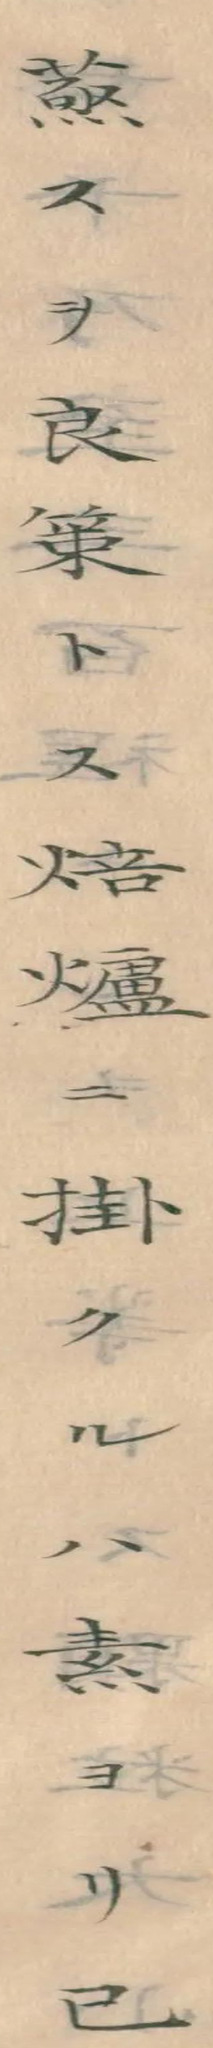蒸スヲ良策トス焙炉ニ掛クルハ素ヨリ已
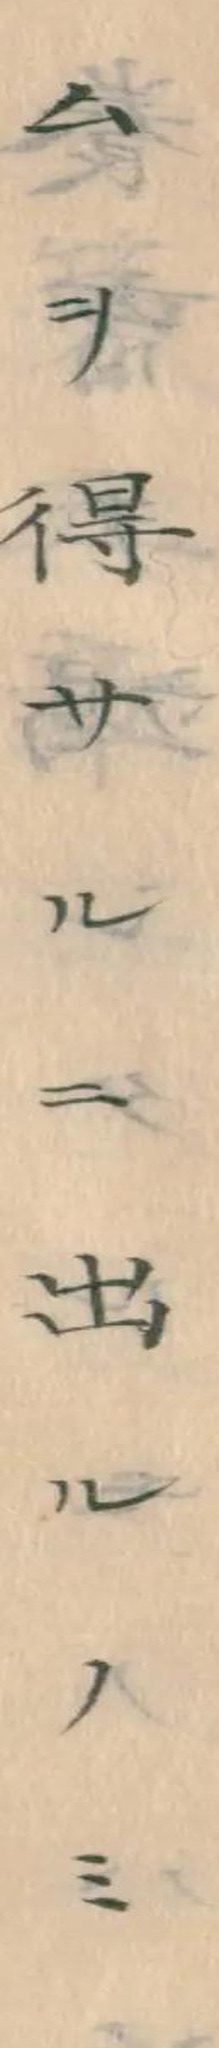ムヲ得サルニ出ルノミ
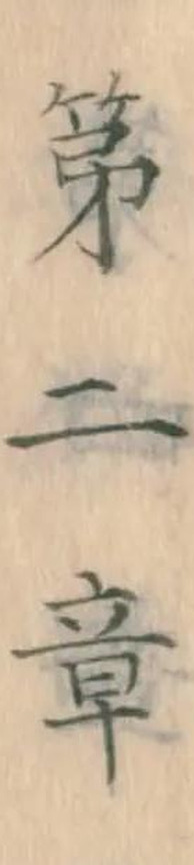第二章
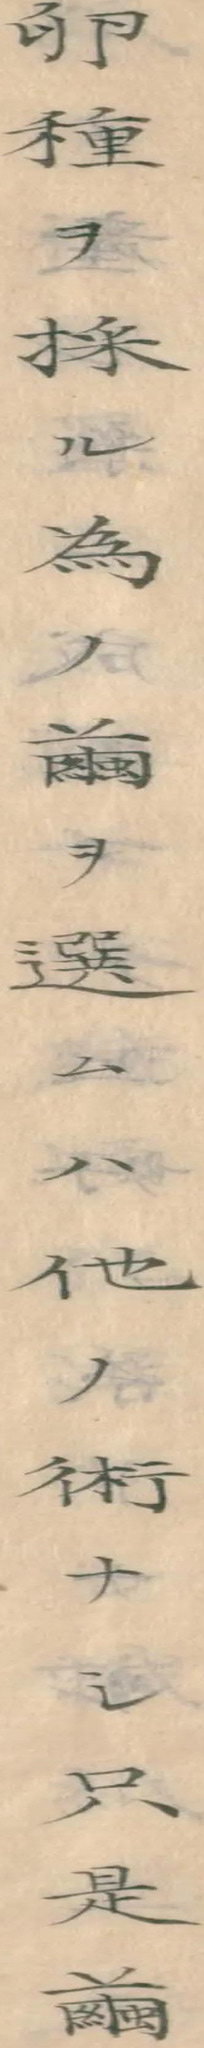卵種ヲ採ル為ノ繭ヲ選ムハ他ノ術ナシ只是繭
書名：蚕桑集成
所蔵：国立国会図書館 National Diet Library, JAPAN
